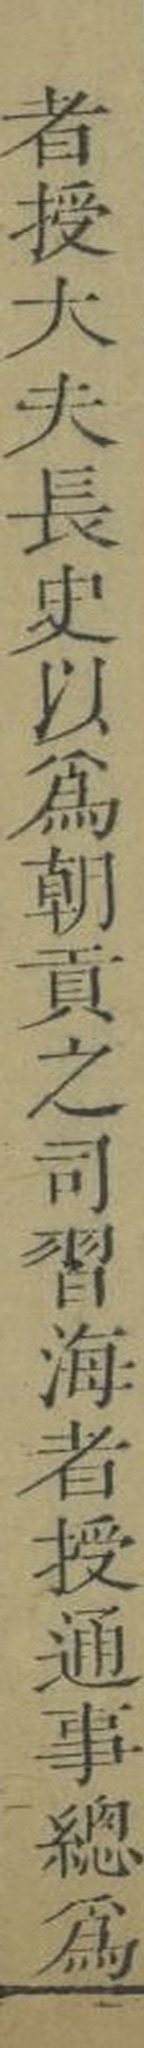者授大夫長史以為朝貢之司習海者授通事総為
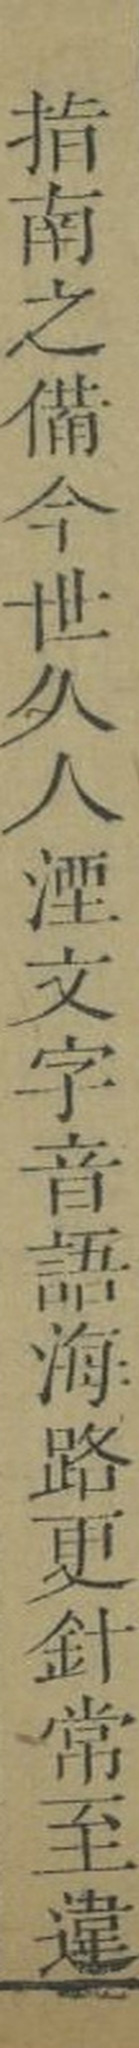指南之備今世久人湮文字音語海路更針常至違
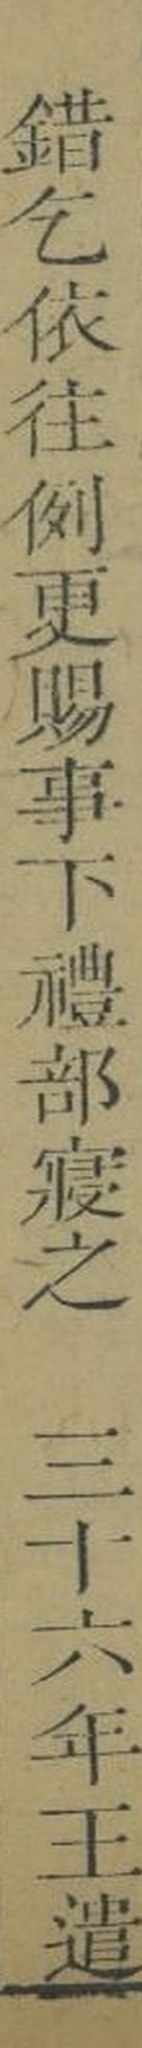錯乞依往例更賜事下礼部寝之三十六年王遣
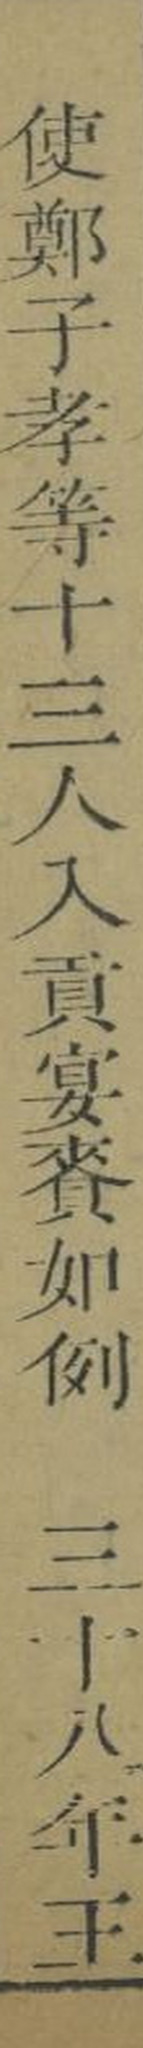使鄭子孝等十三人入貢宴賚如例三十八年王
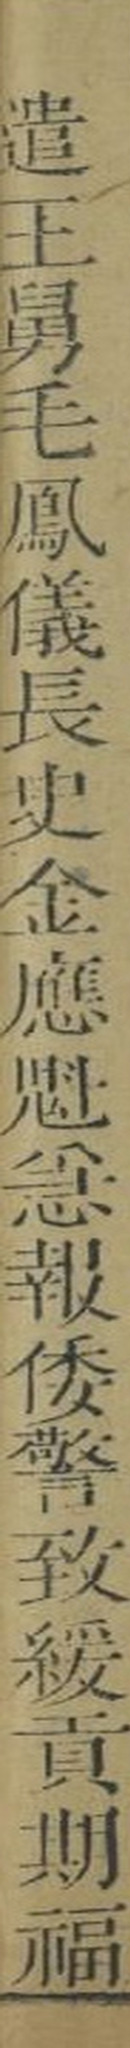遣王舅毛鳳儀長史金応魁急報倭警致緩貢期福
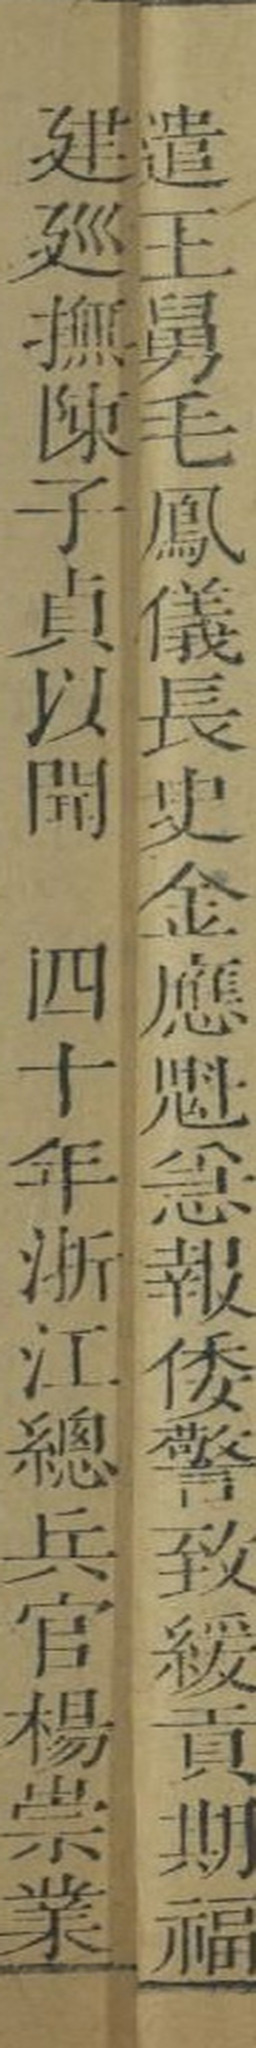建巡撫陳子貞以聞四十年浙江総兵官楊崇業
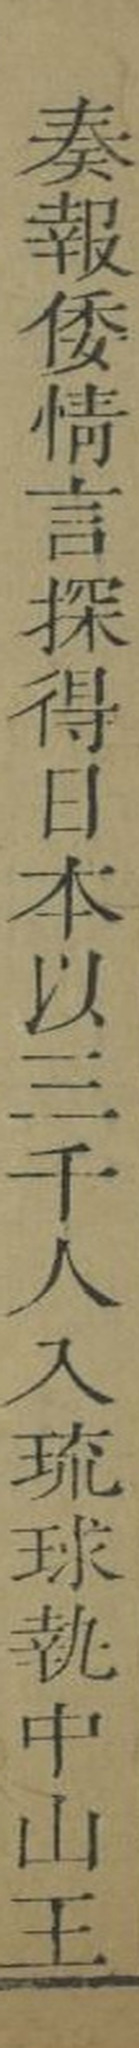奏報倭情言探得日本以三千人入琉球執中山王
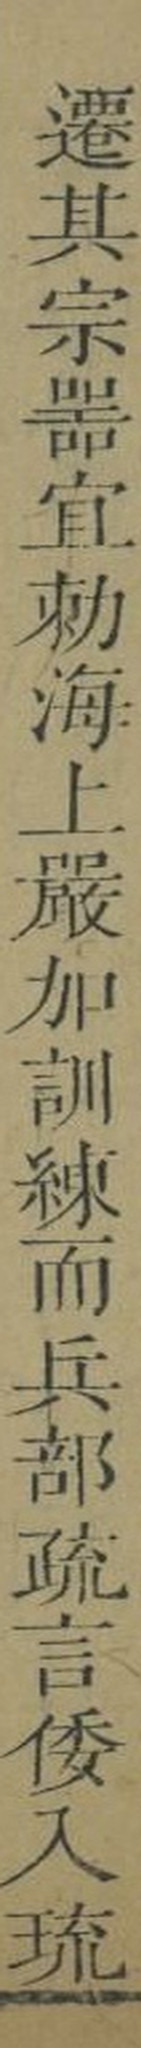遷其宗器宜勅海上厳加訓練而兵部疏言倭入琉
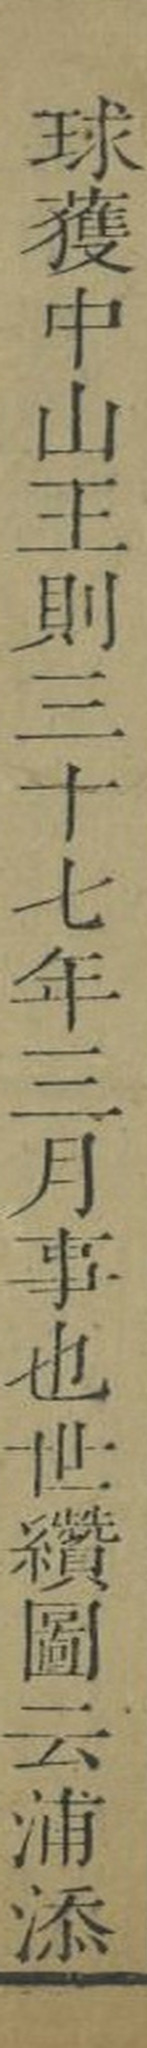球獲中山王則三十七年三月事也世纘図云浦添
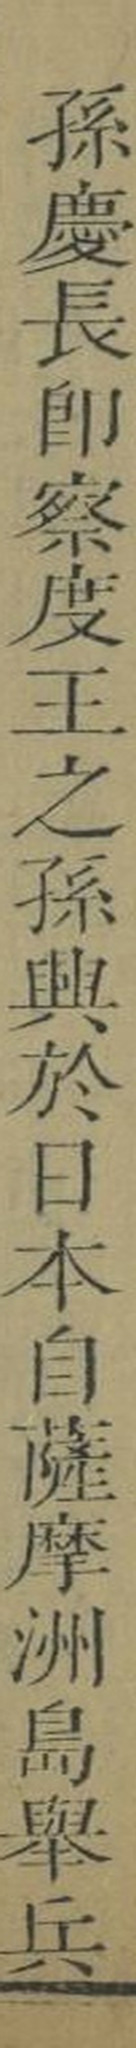孫慶長即察度王之孫興於日本自薩摩洲島挙兵

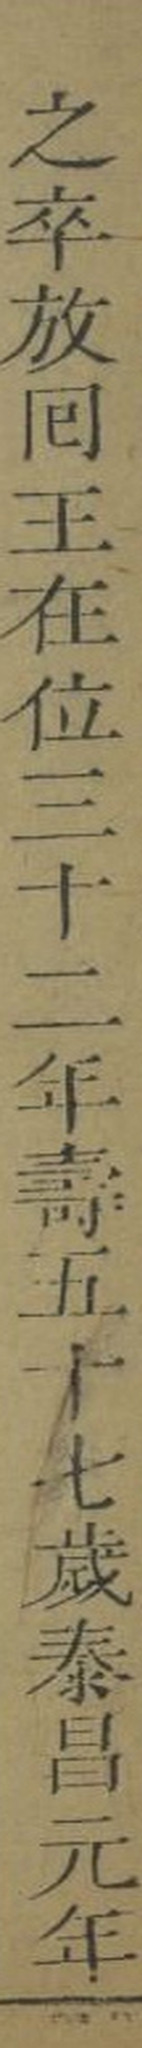之卒放回王在位三十二年寿五十七歳泰昌元年
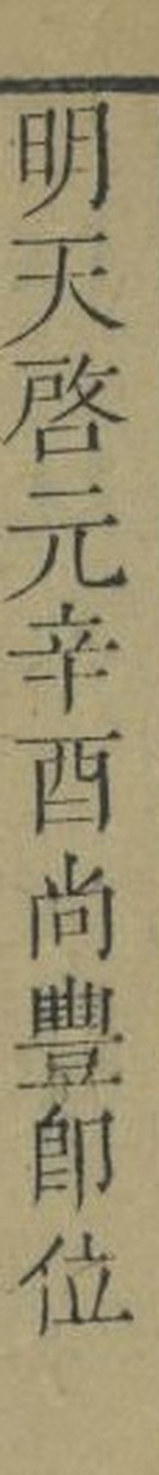明天啓元辛酉尚豊即位
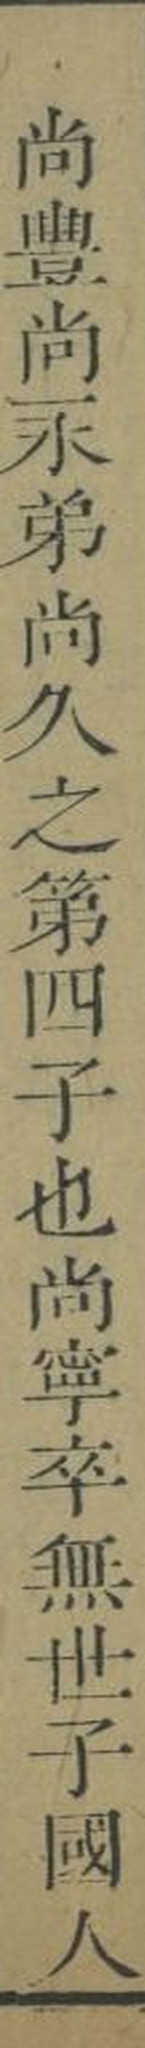尚豊尚永弟尚久之第四子也尚寧卒無世子国人
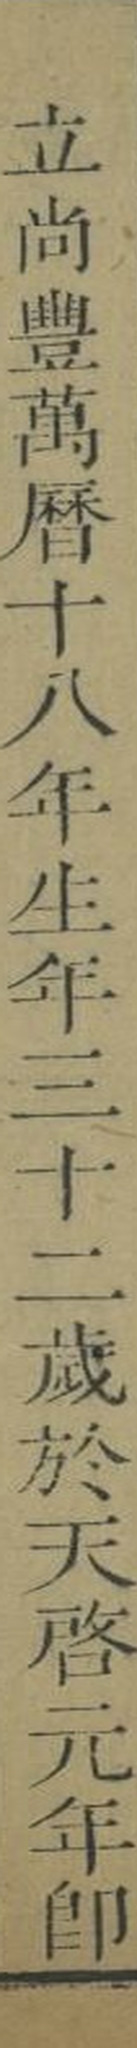立尚豊万暦十八年生年三十二歳於天啓元年即
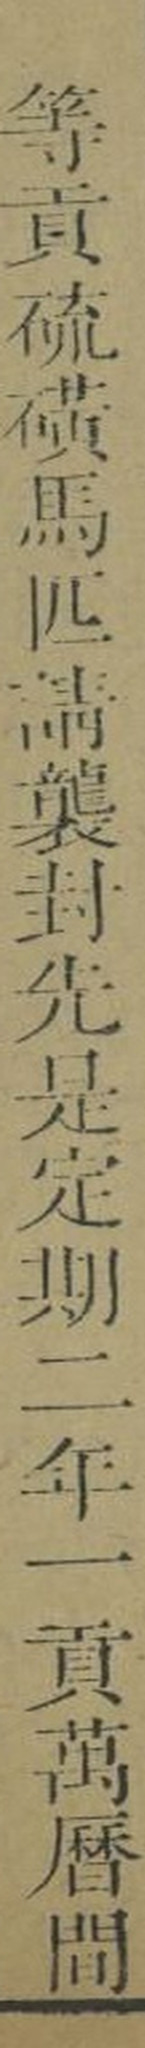等貢硫磺馬匹請襲封先是定期二年一貢万暦間
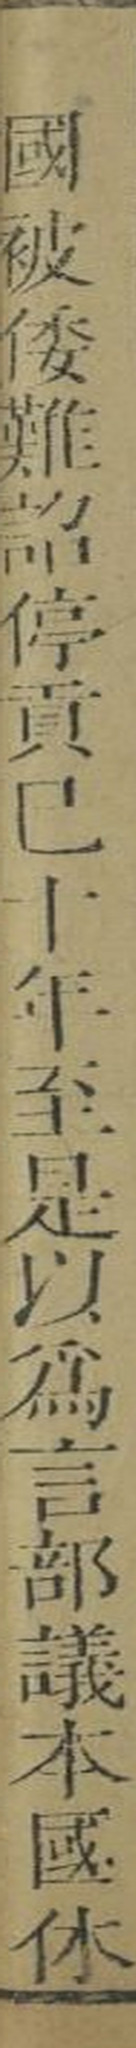国被倭難詔停貢巳十年至是以為言部議本国休
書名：中山伝信録 巻四
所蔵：University of the Ryukyus Library
